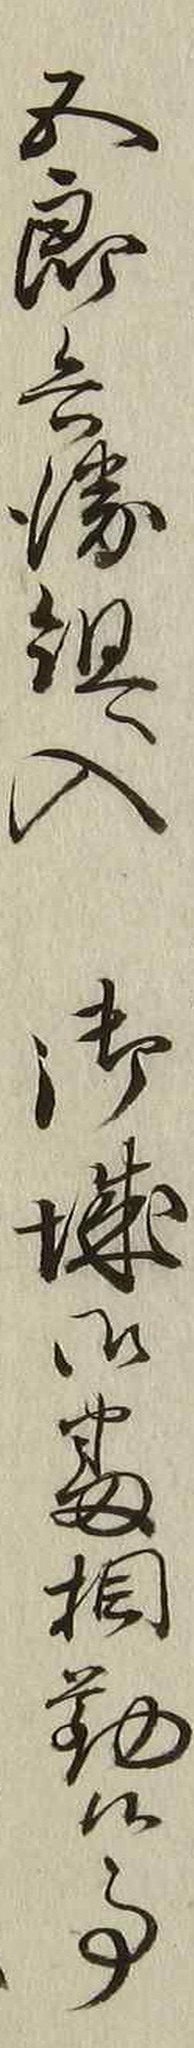五郎兵衛組へ入御城御番相勤候事
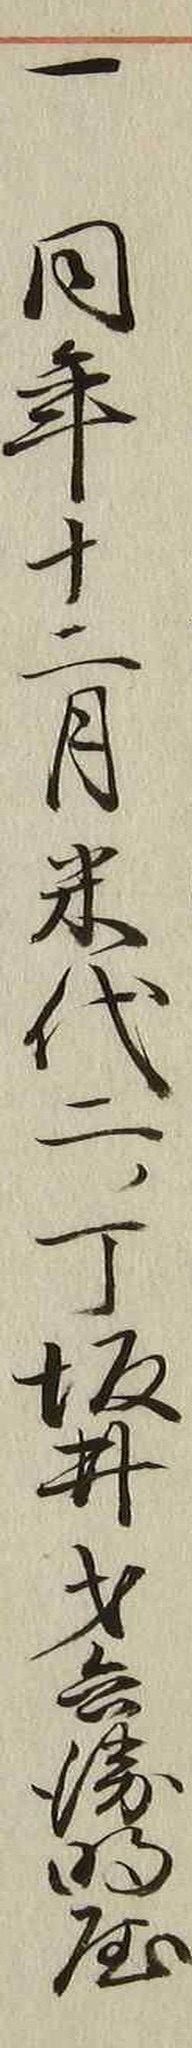一同年十二月米代二ノ丁坂井才兵衛明屋
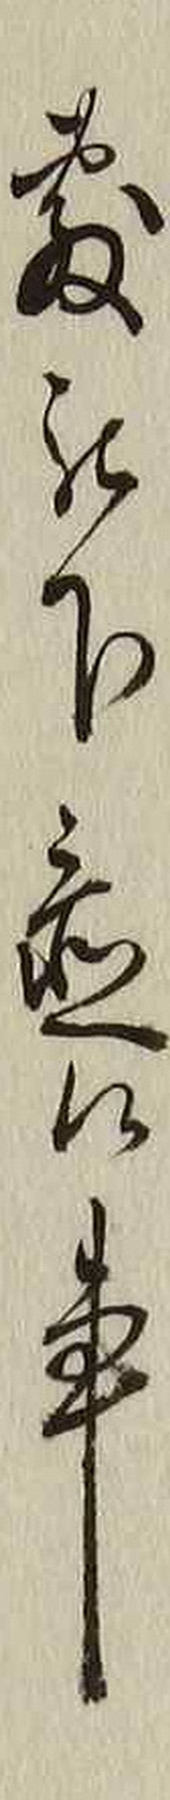敷被下置候事
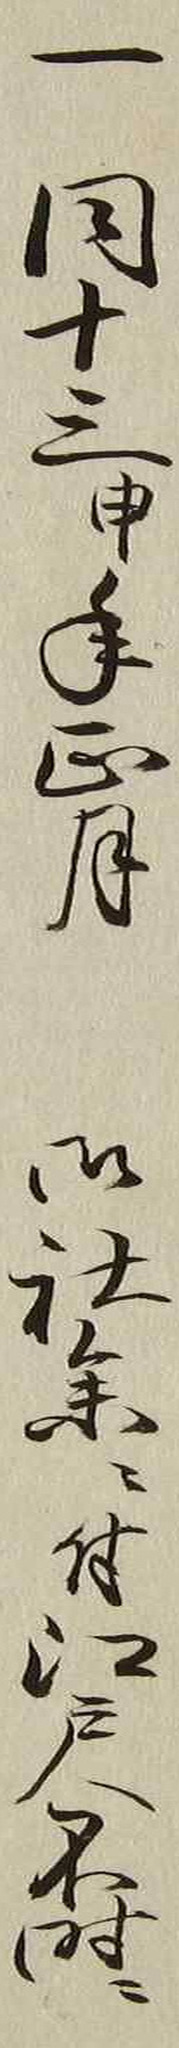一同十三申年正月御社参ニ付江戸へ不時ニ
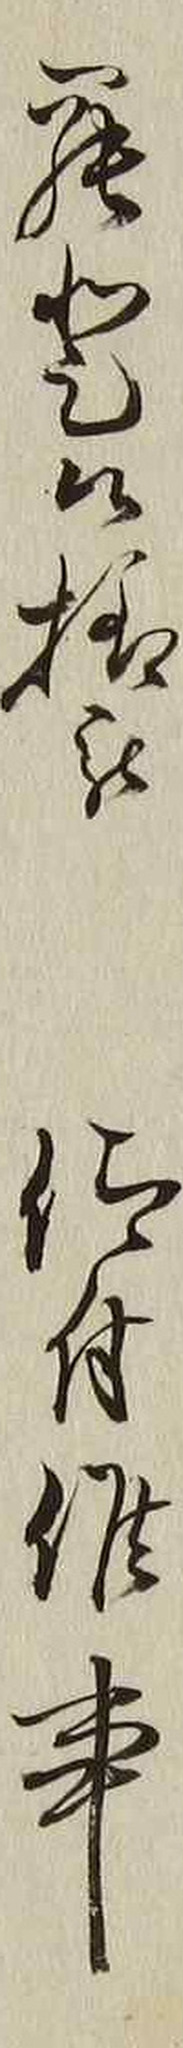罷登候様被仰付候事
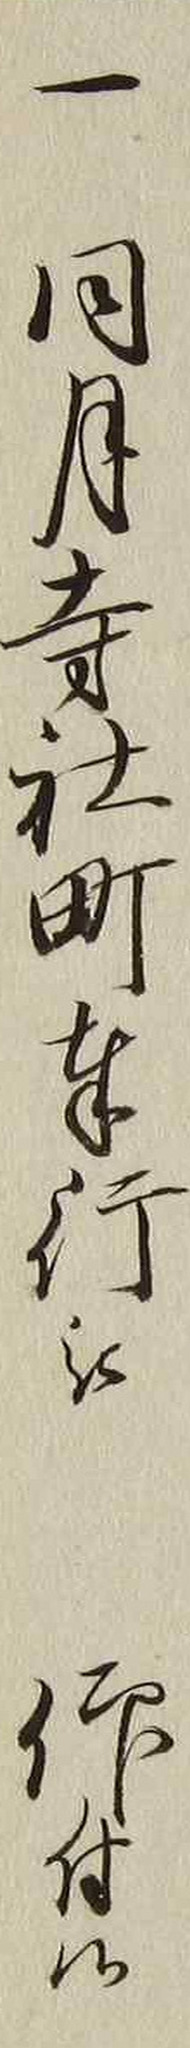一同月寺社町奉行被仰付候
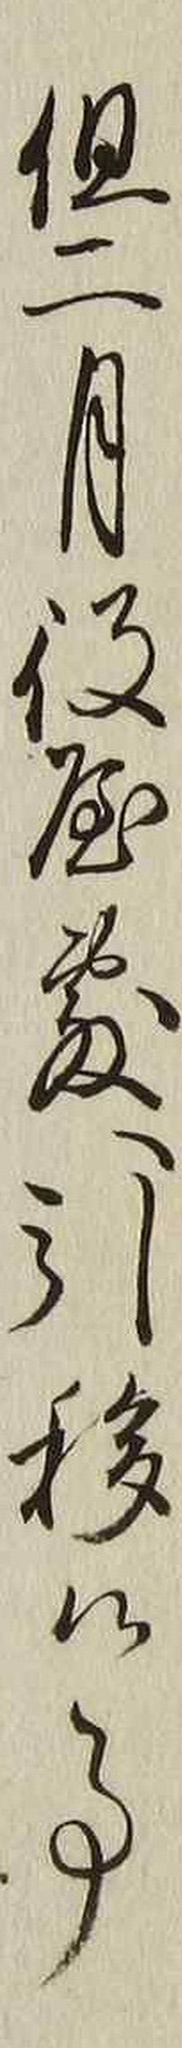但二月役屋敷へ引移候事
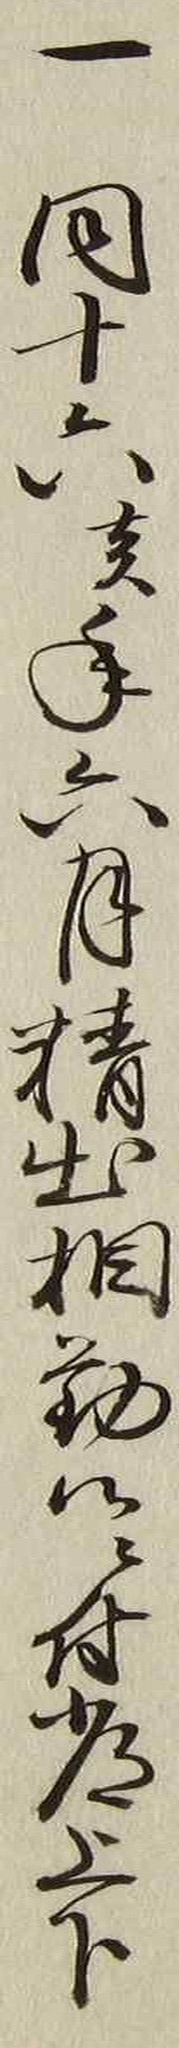一同十六亥年六月精出相勤候ニ付常上下
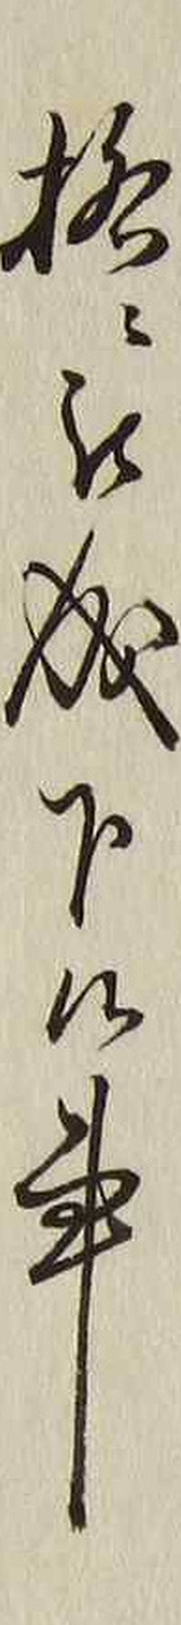格ニ被成下候事
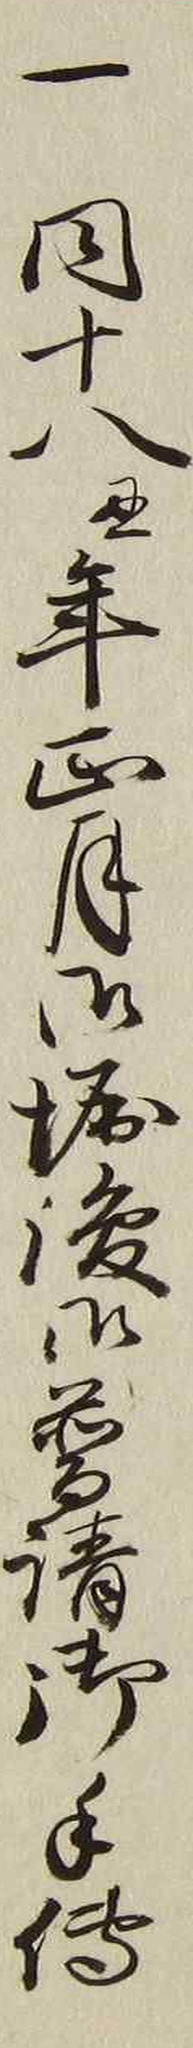一同十八丑年正月御堀浚御普請御手伝
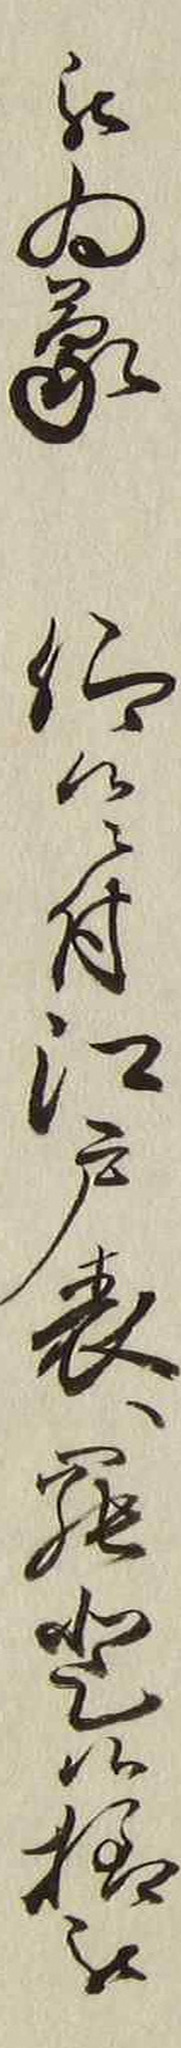被為蒙仰候ニ付江戸表へ罷登候様被
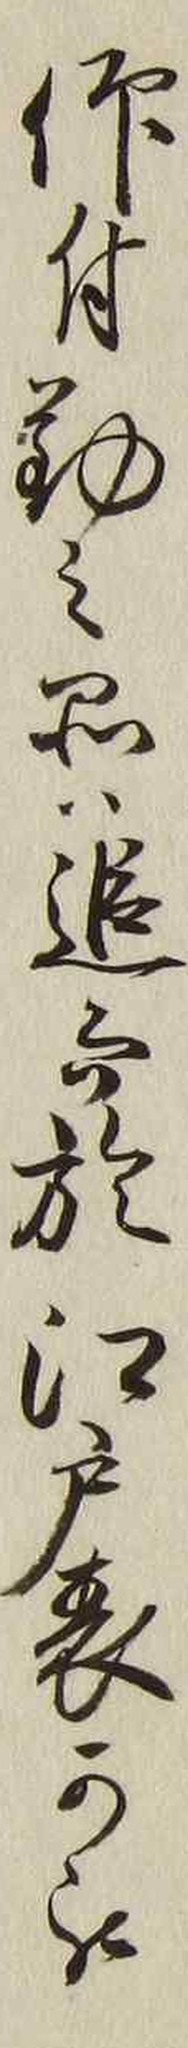仰付勤之品ハ追而於江戸表可被
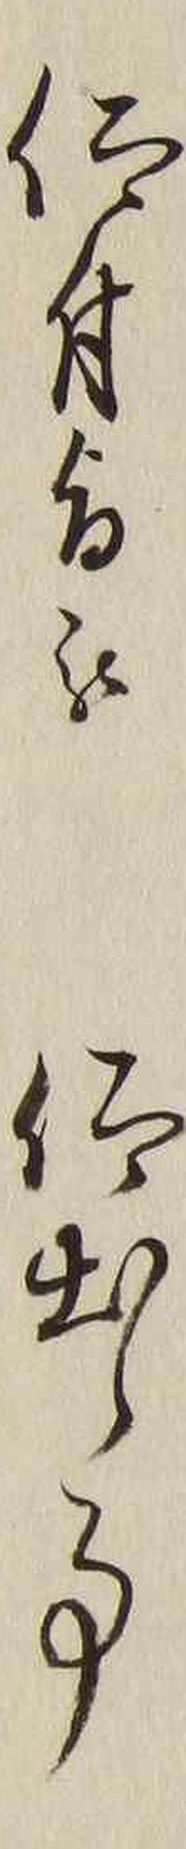仰付旨被仰出候事

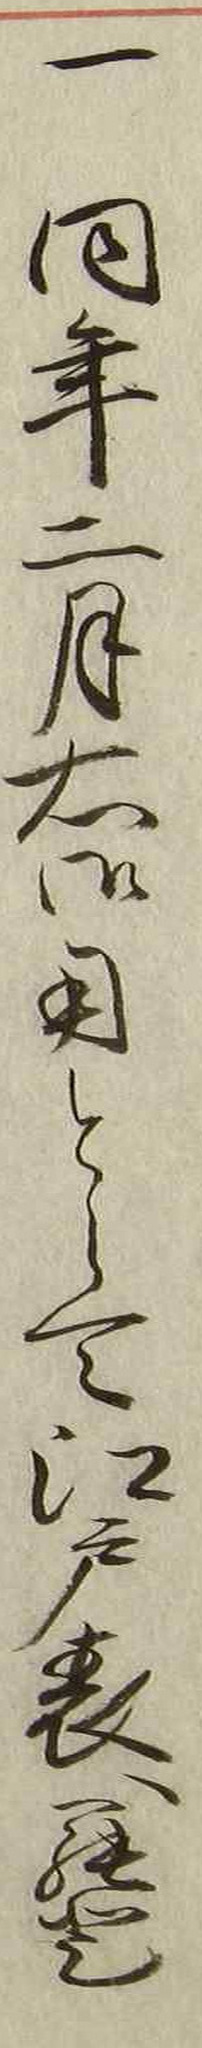一同年二月右御用として江戸表へ罷登
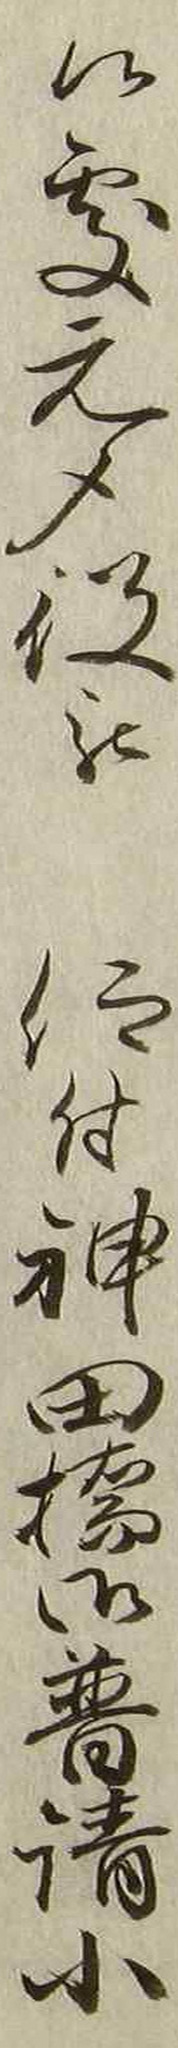候処元〆役被仰付神田橋御普請小
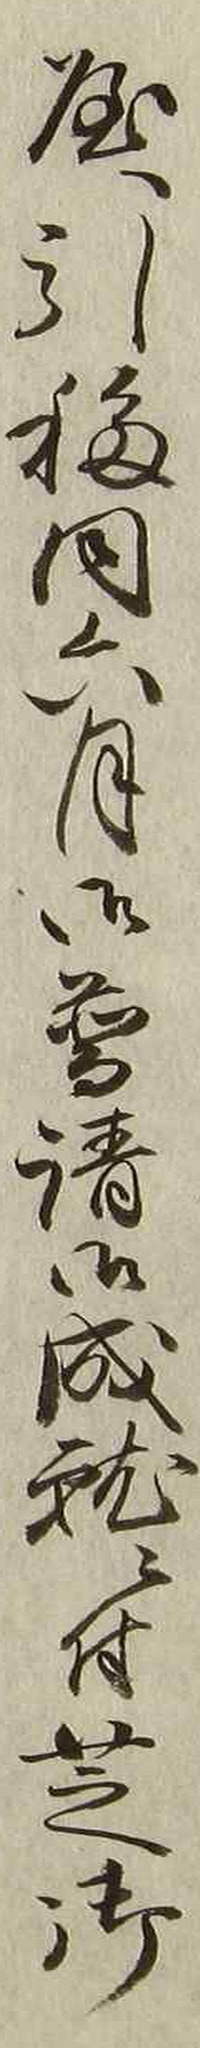屋へ引移同六月御普請御成就ニ付芝御
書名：諸士系譜　巻之21　い之部21
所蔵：会津若松市立会津図書館
